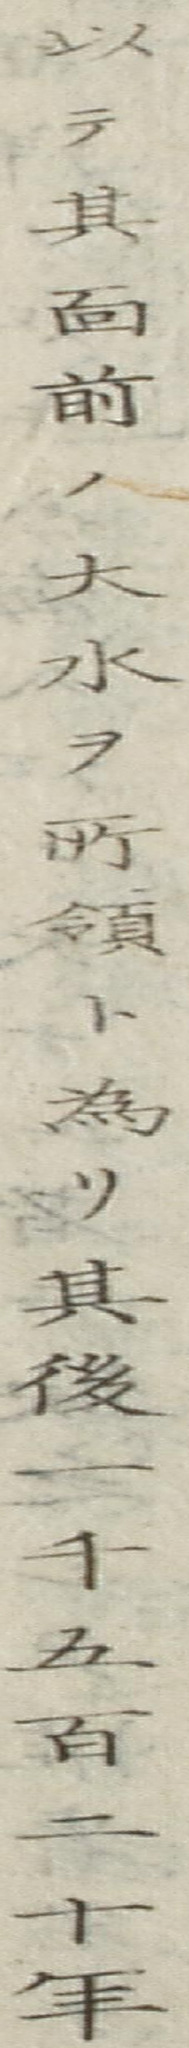以テ其面前ノ大水ヲ所領ト為リ其後一千五百二十年
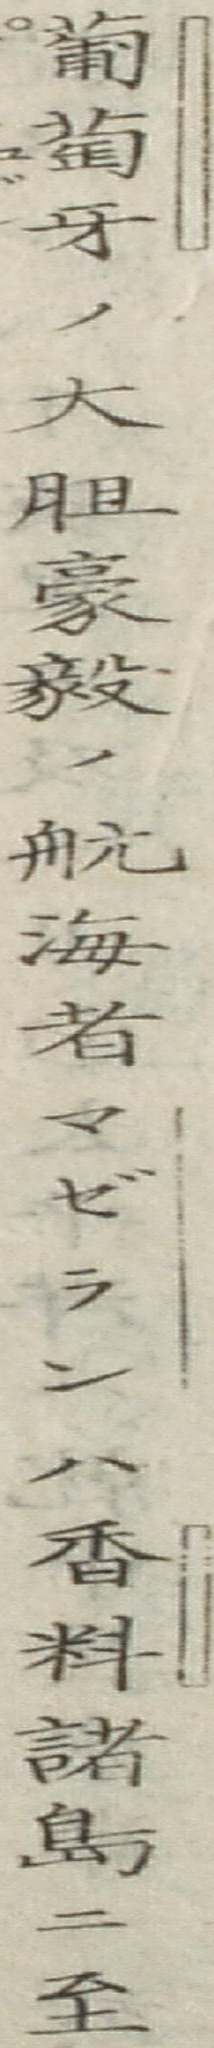葡萄牙ノ大胆豪毅ノ航海者マゼランハ香料諸島ニ至
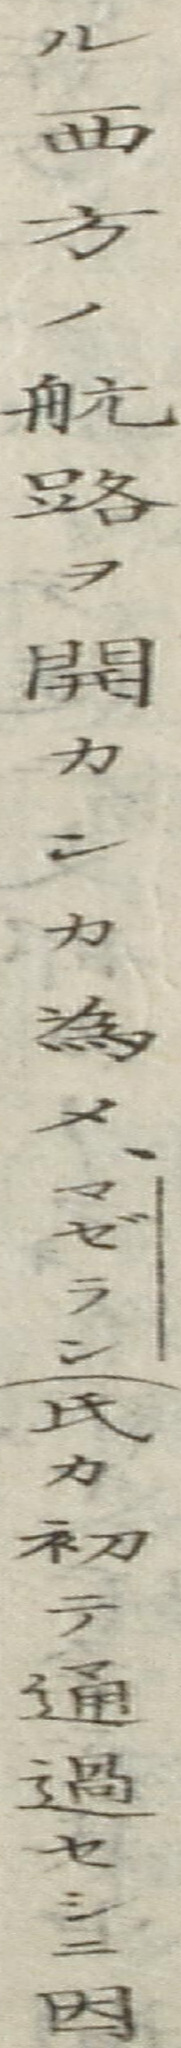ル西方ノ航路ヲ開カンカ為メ、マゼラン（氏カ初テ通過セシニ因
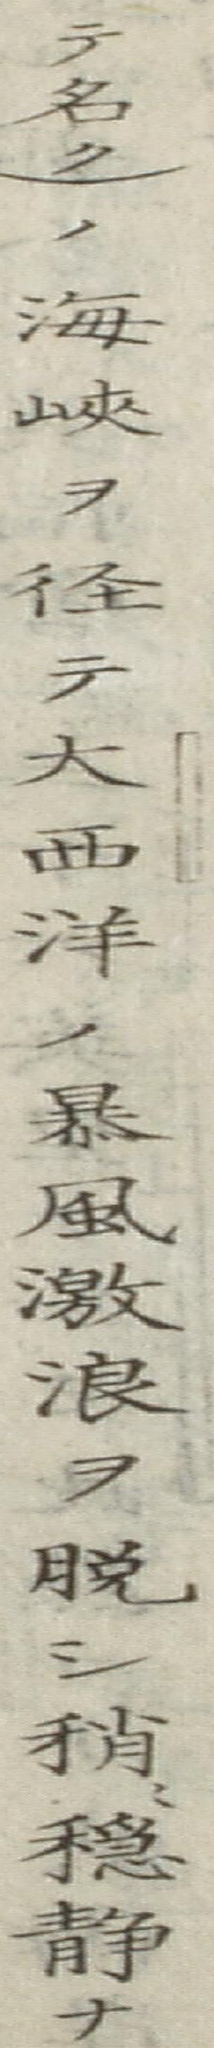テ名ク）ノ海峡ヲ径テ大西洋ノ暴風激浪ヲ脱シ稍々穏静ナ
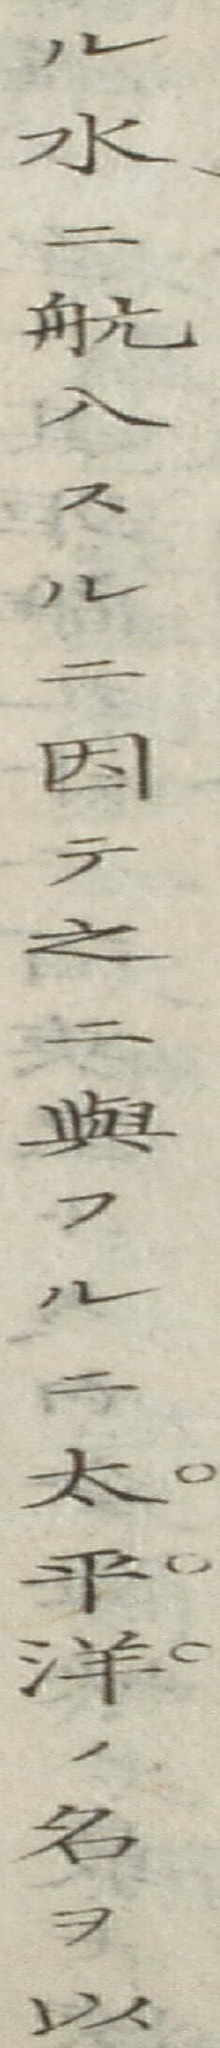ル水ニ航入スルニ因テ之ニ與フルニ太平洋ノ名ヲ以
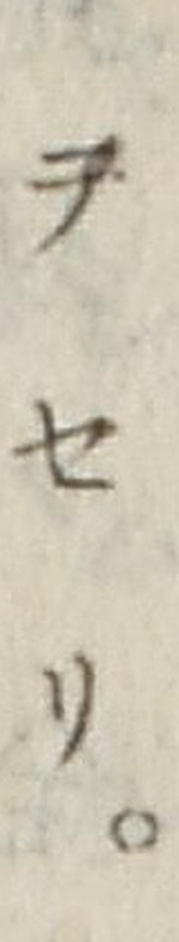テセリ。
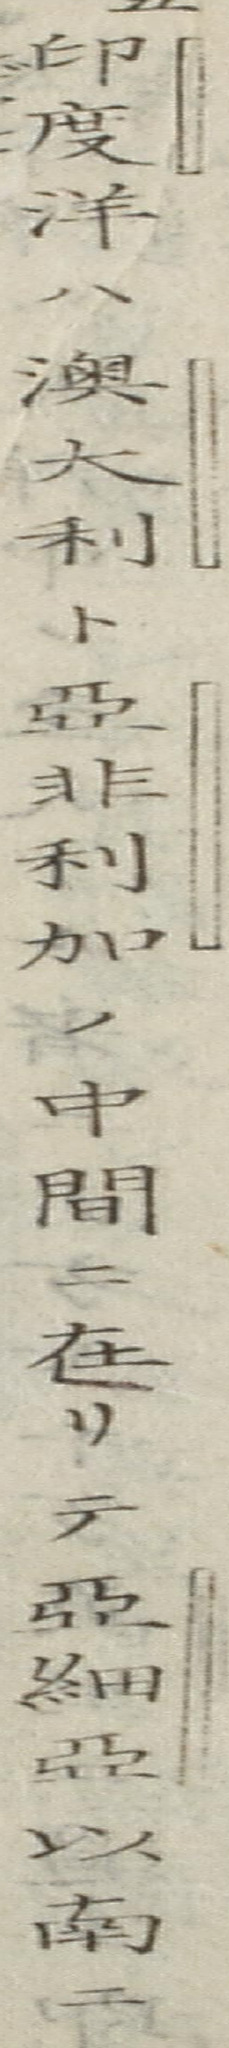五印度洋ハ澳大利ト亜非利加ノ中間ニ在リテ亜細亜以南ニ
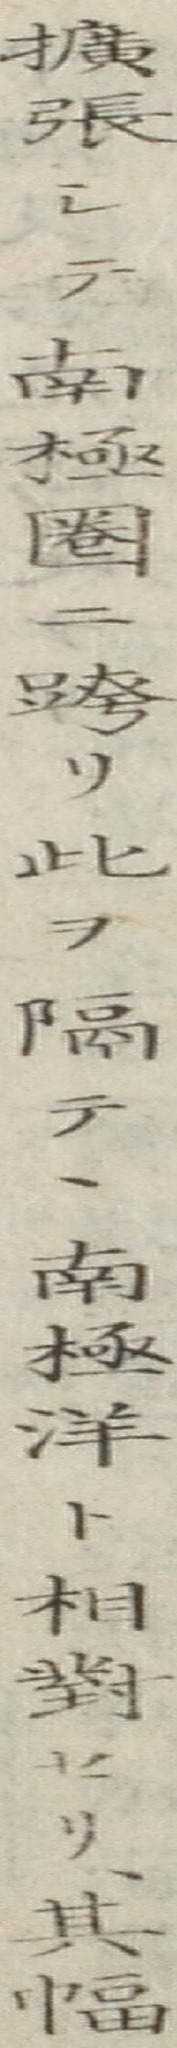拡張シテ南極圏ニ跨リ此ヲ隔テヽ南極洋ト相対セリ、其幅
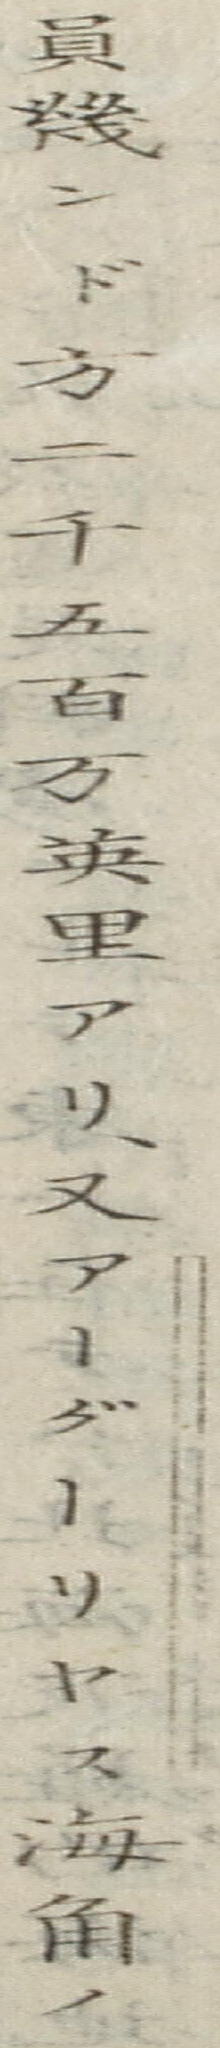員幾ンド方二千五百万英里アリ、又アーグーリヤス海角ノ
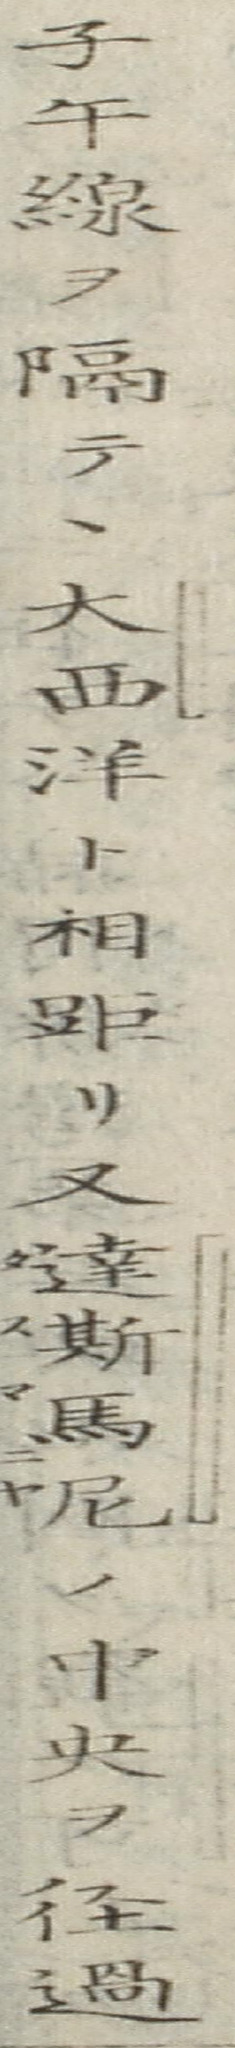子午線ヲ隔テ、大西洋ト相距リ又達斯馬尼ノ中央ヲ径過
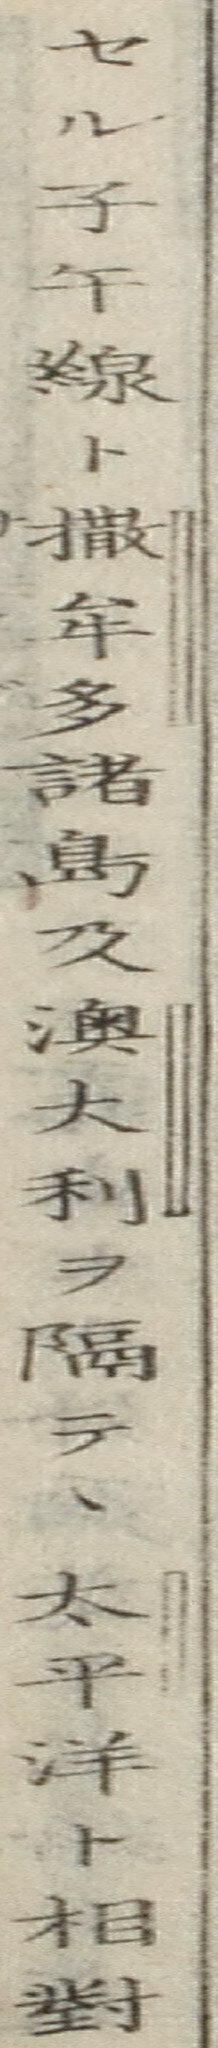セル子午線ト撒牟多諸島及澳大利ヲ隔テヽ太平洋ト相対
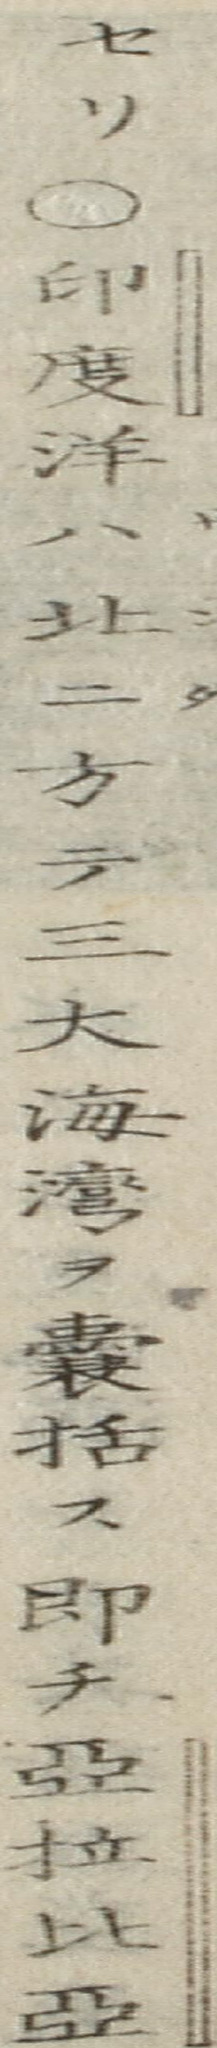セリ○印度洋ハ北ニ方テ三大海湾ヲ嚢括ス即チ亜拉比亜
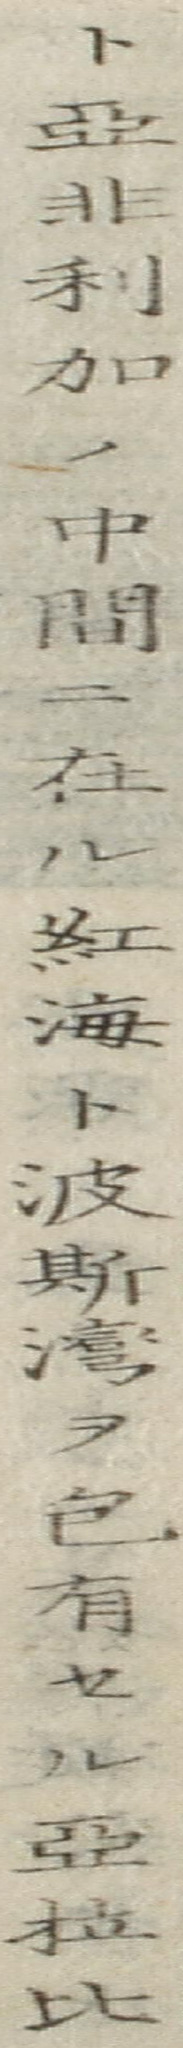ト亜非利加ノ中間ニ在ル紅海ト波斯湾ヲ包有セル亜拉比
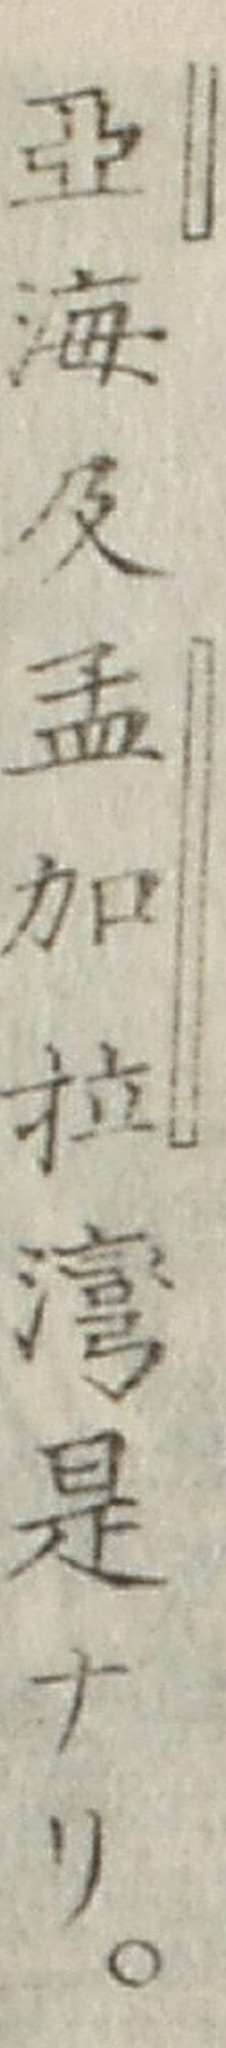亜海及孟加拉湾是ナリ。
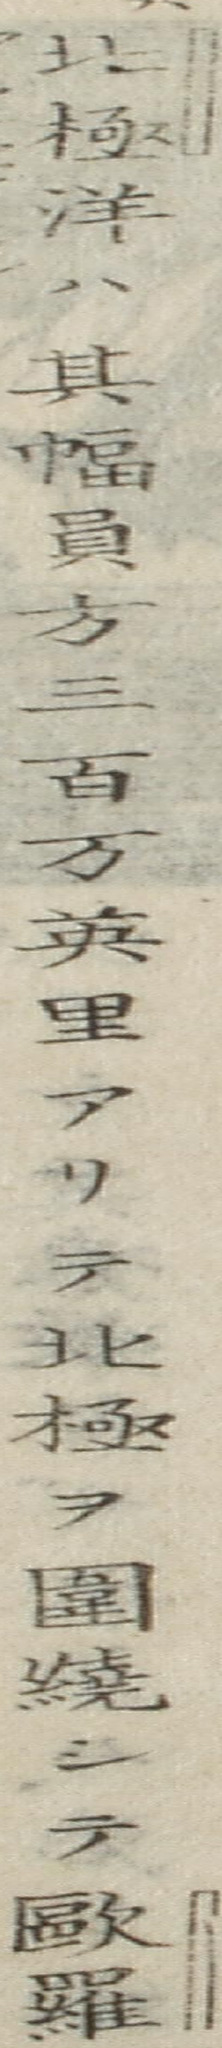六北極洋ハ其幅員方三百万英里アリテ北極ヲ囲繞シテ欧羅
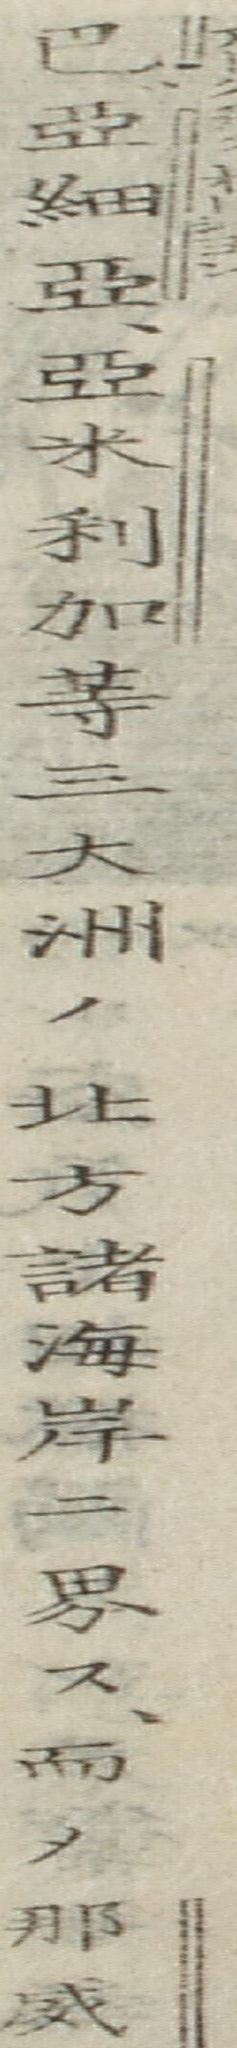巴、亜細亜、亜米利加等三大洲ノ北方諸海岸ニ界ス、而シテ那威
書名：地形論　巻二
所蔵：東京大学地震研究所図書室 Earthquake Research Institute Library, The University of Tokyo, JAPAN
